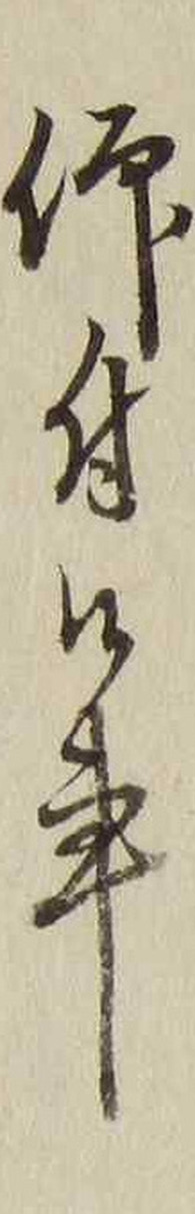仰付候事

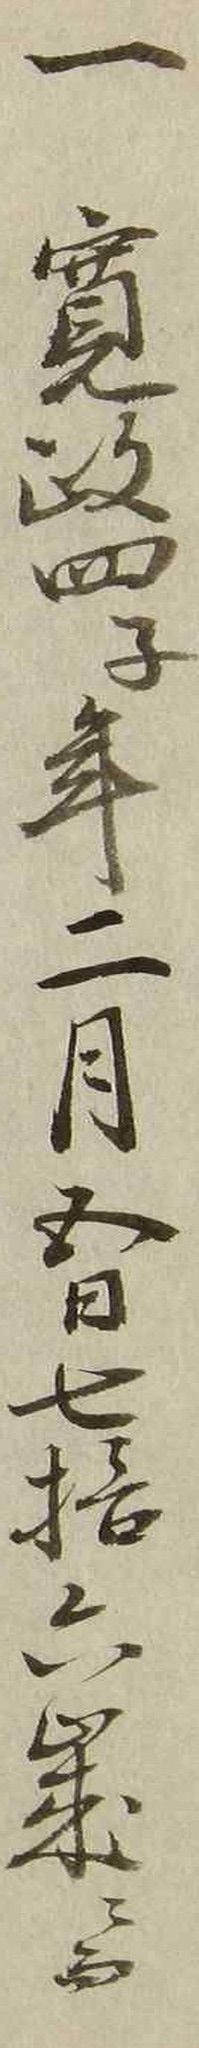一寛政四子年二月五日七拾六歳ニ而
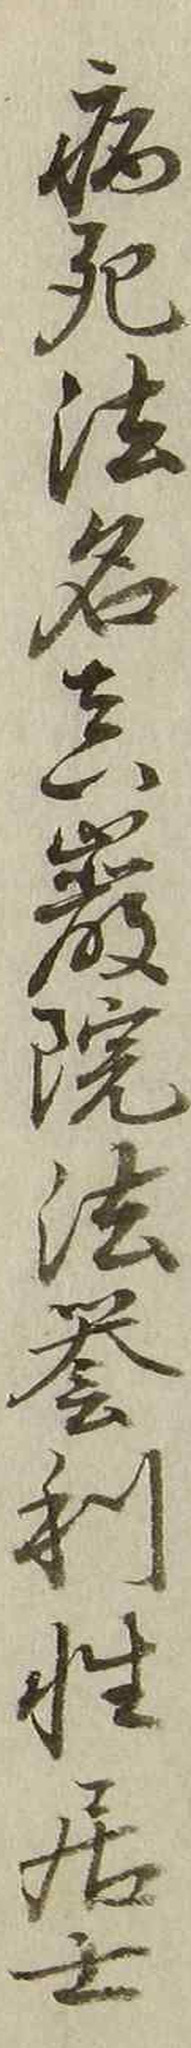病死法名真巌院法誉利性居士
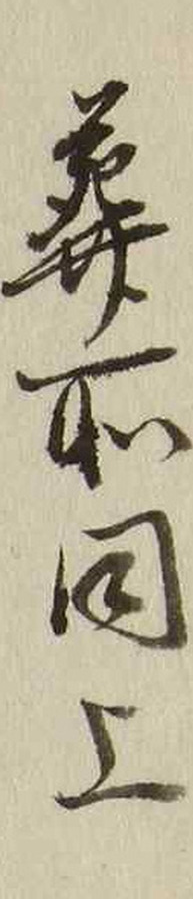葬所同上
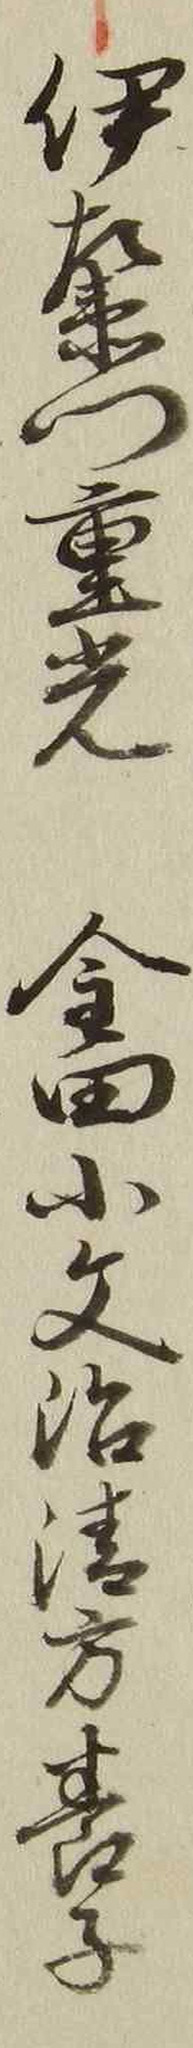伊左衛門重光金田小文治清方養子
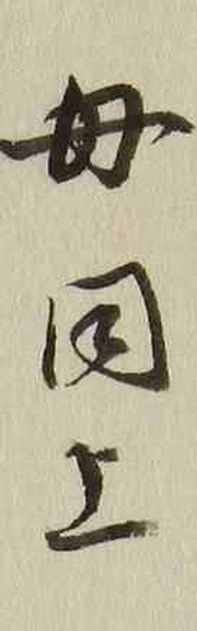母同上
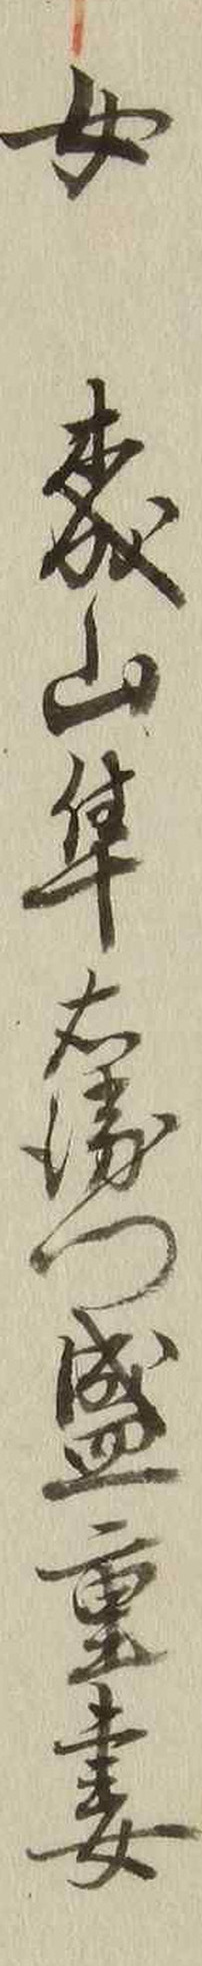女森山隼右衛門盛重妻
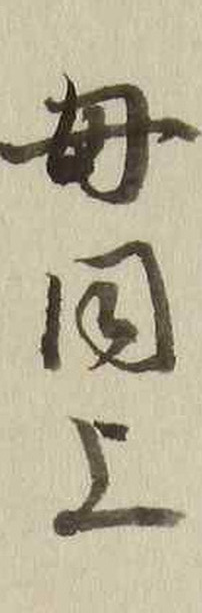母同上
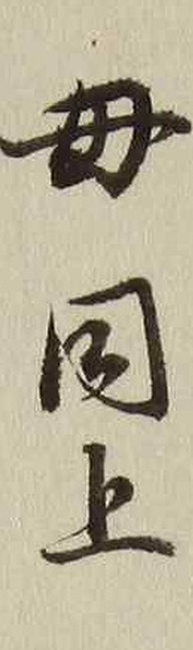母同上
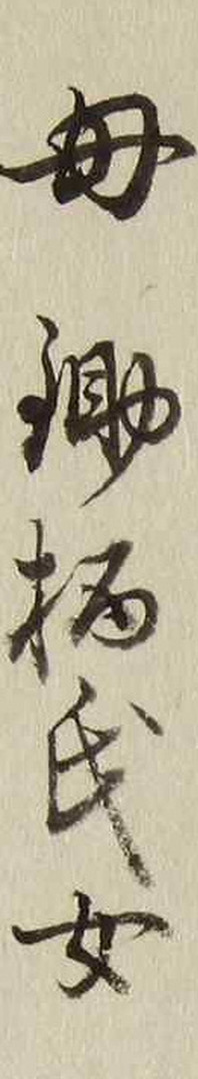母鋤柄氏女
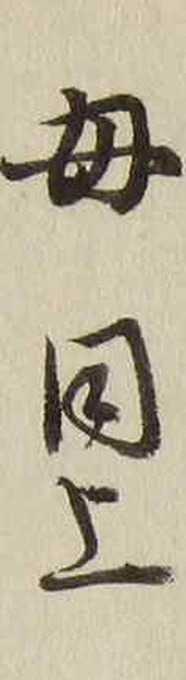母同上

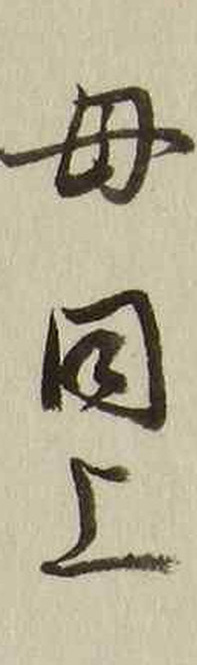母同上
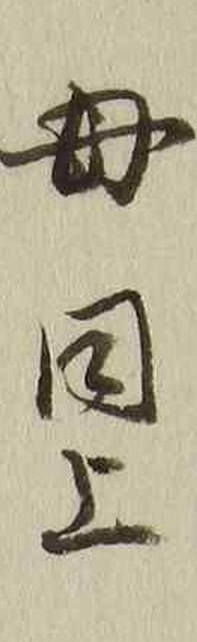母同上
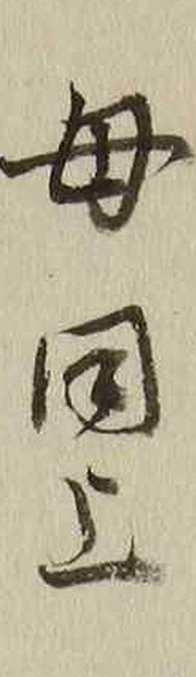母同上
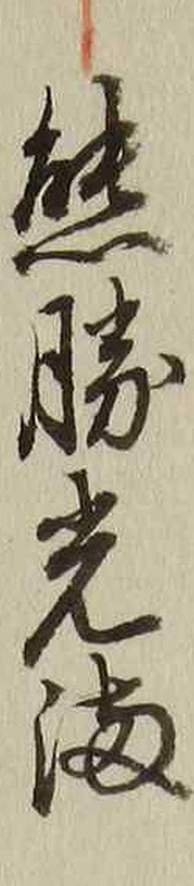熊勝光満
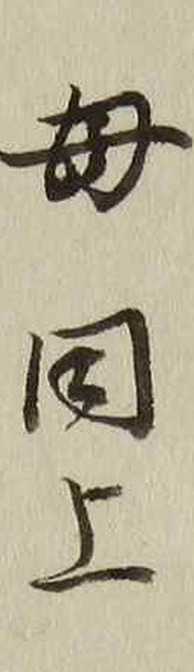母同上
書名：諸士系譜　巻之27　い之部27
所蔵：会津若松市立会津図書館
